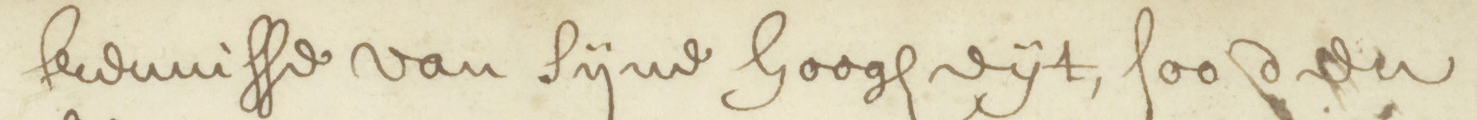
kennisse van Sijne hoogheijt, soo den
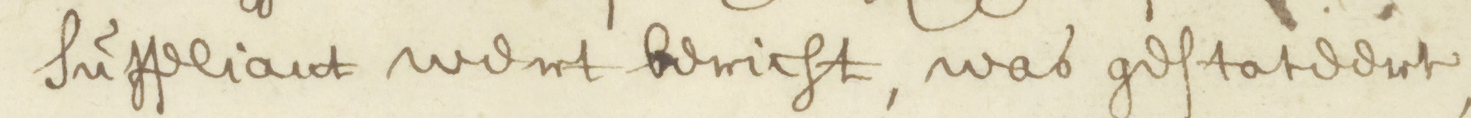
Suppliant wert bericht, was gestateert,
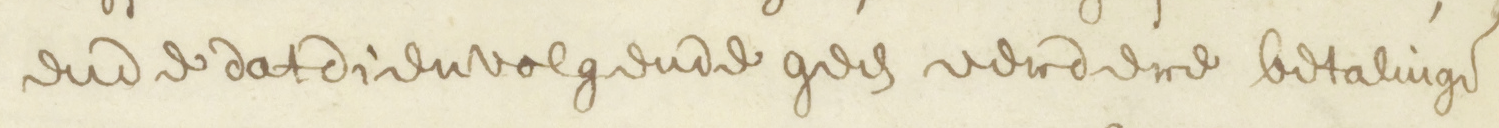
ende dat dienvolgende geen verdere betalinge
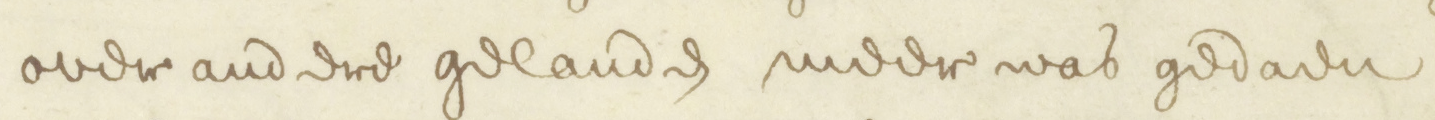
over andere gelanden meer was gedaen,
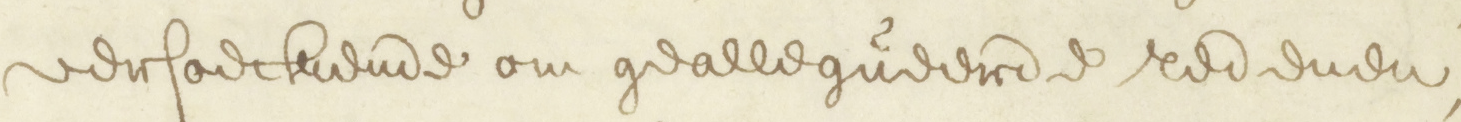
versoeckende om geallegueerde redenen,
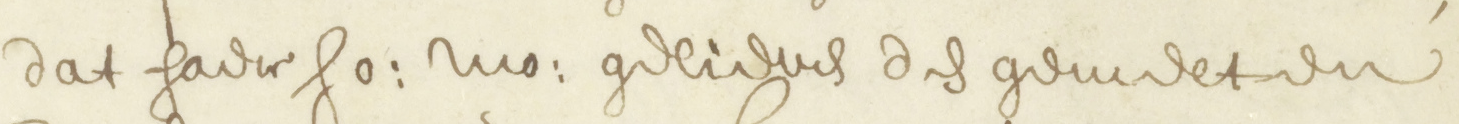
dat haer ho:Mo: gelieven den gemelten
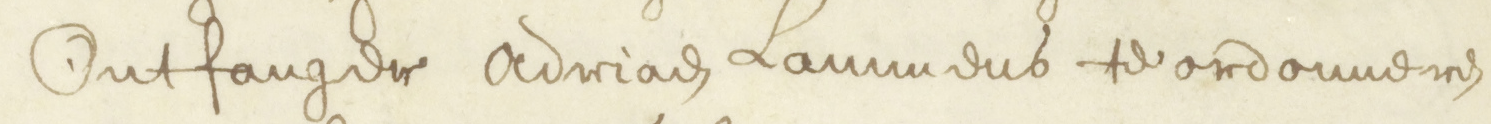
Ontfanger Adriaen Lammens te ordonneren,
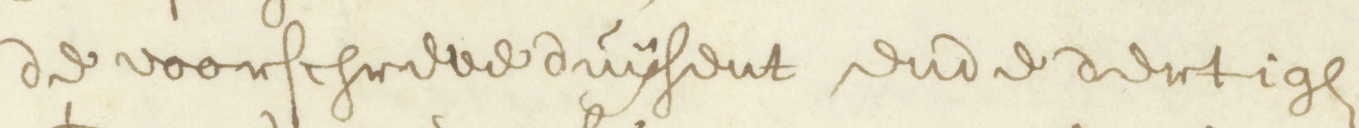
de voorschreve duijsent ende dertigh
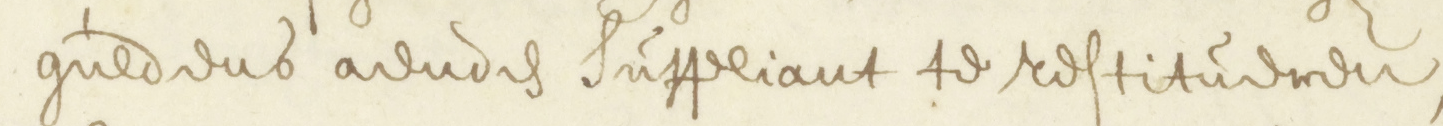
guldens aenden Suppliant te restitueren,
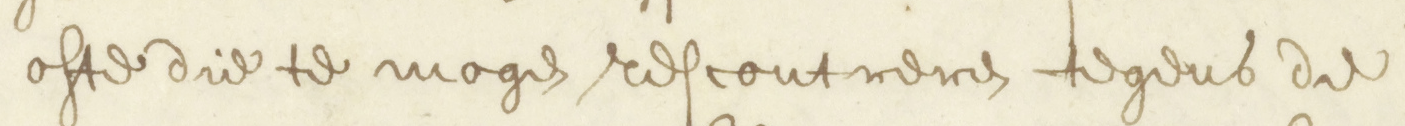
ofte die te mogen rescontreren tegens de
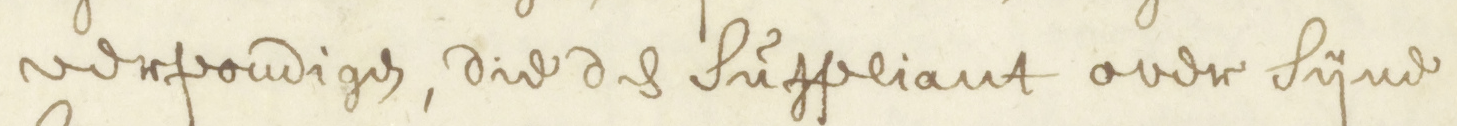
verpondigen, die den Suppliant over Sijne
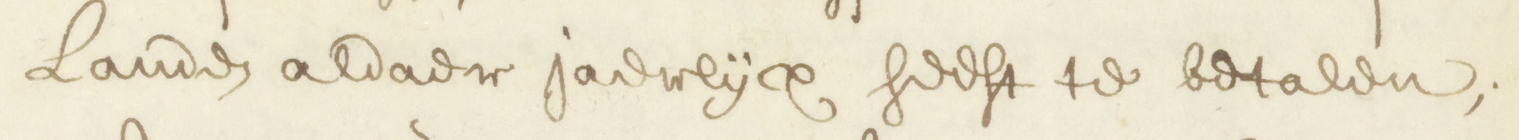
Landen aldaer jaerlijcx heeft te betalen;
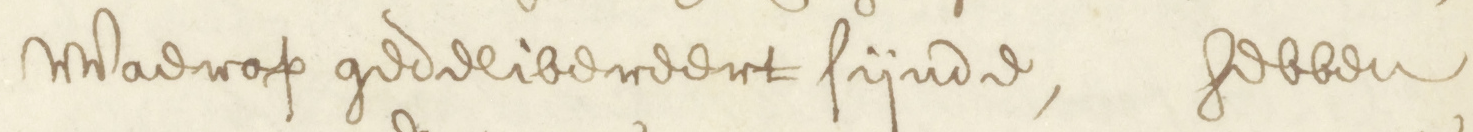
Waerop gedelibereert sijnde, hebben
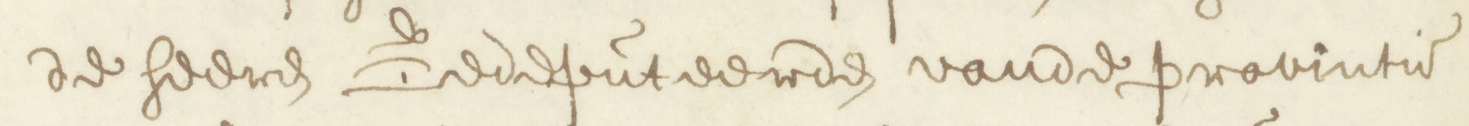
de heeren Gedeputeerden vande provintie
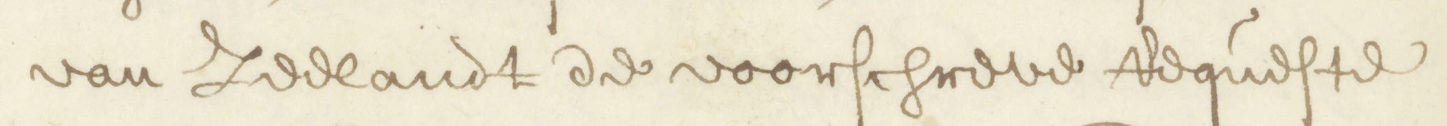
van Zeelandt de voorschreve Requeste
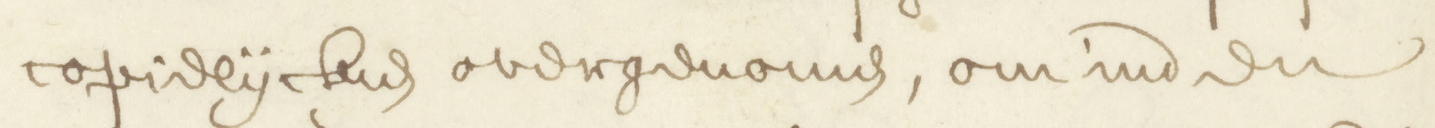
copielijcken overgenomen, om inden
